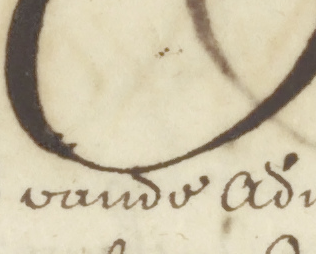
O
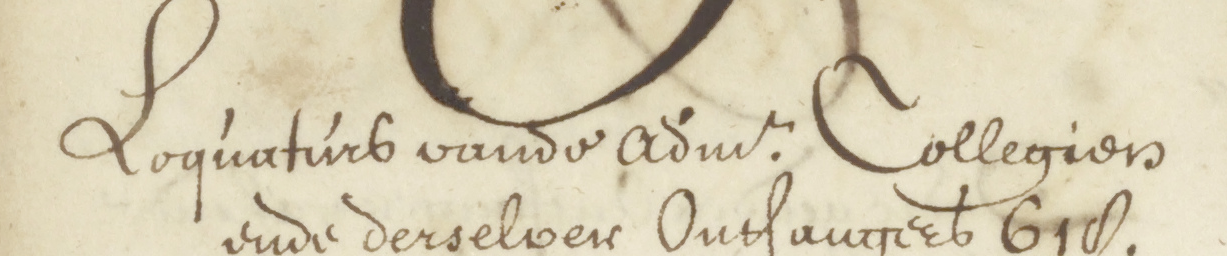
Loquaturs vande Admt. Collegien
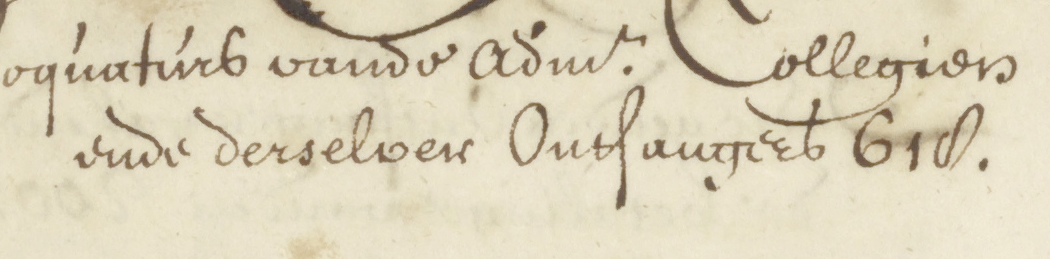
ende derselver Ontfangers 618.
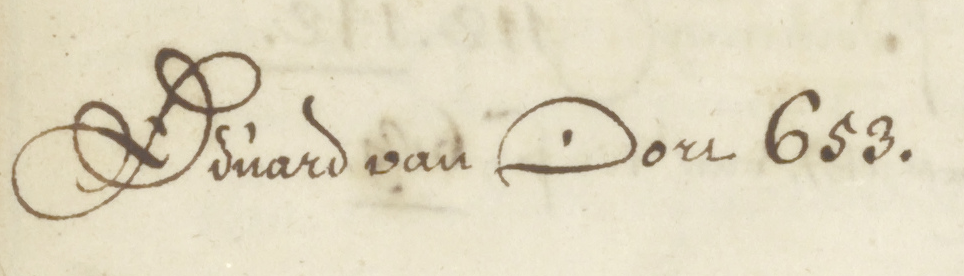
Eduard van Oort 653.
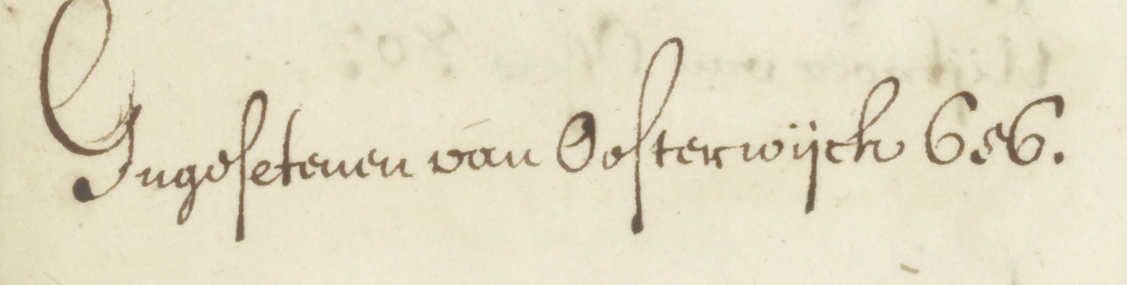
Ingesetenen van Oosterwijck 656.
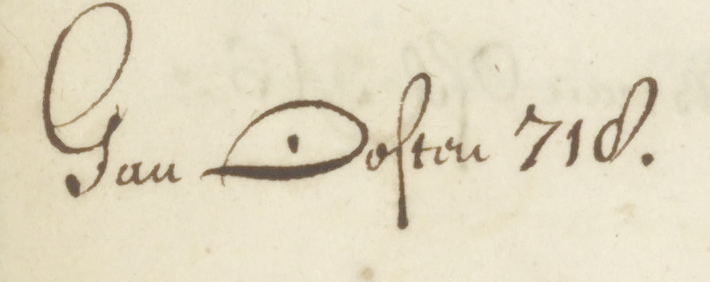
Jan Oosten 718.
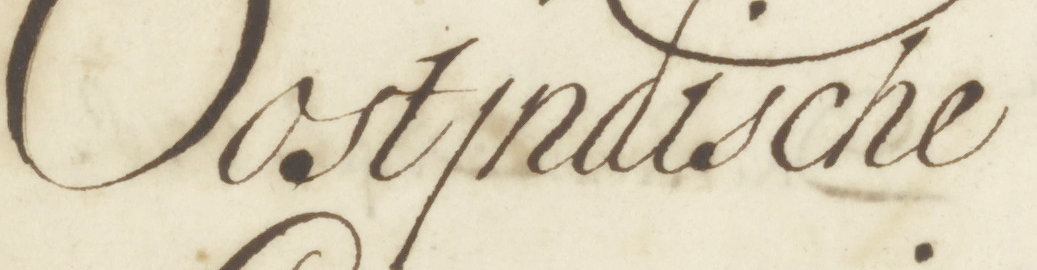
Oostindische
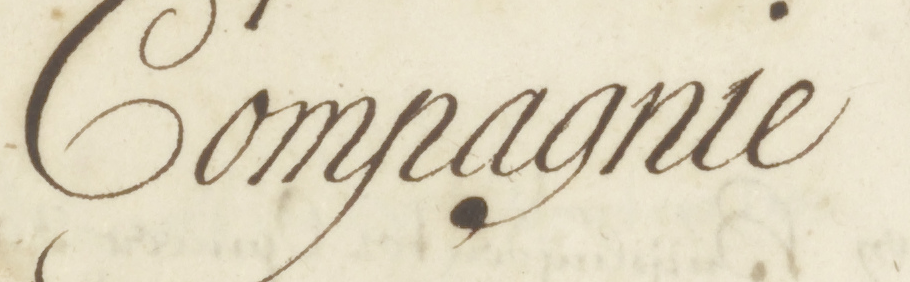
Compagnie
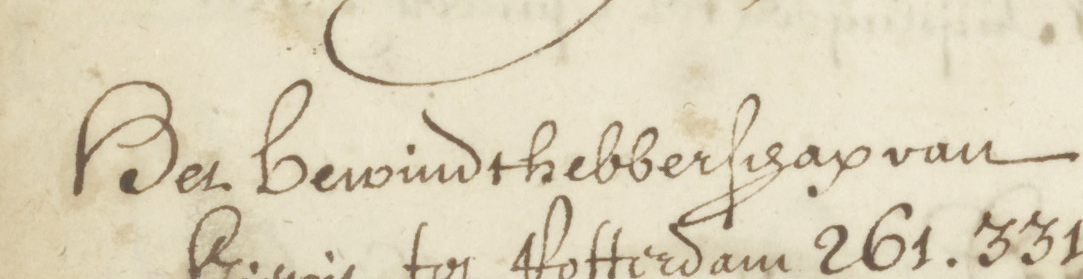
Het bewindthebberschap van
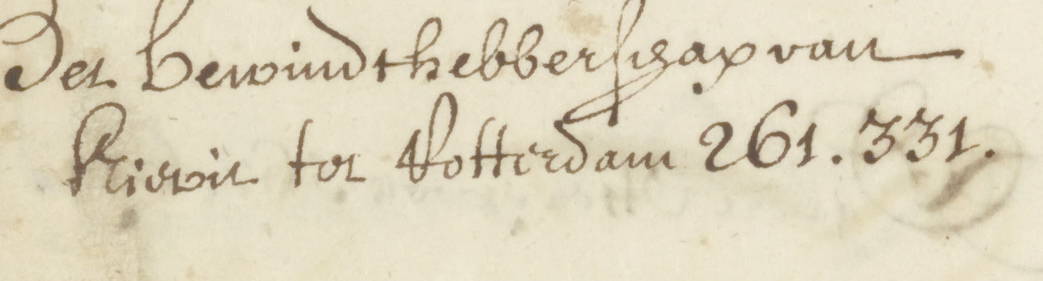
Kievit tot Rotterdam 261, 331.
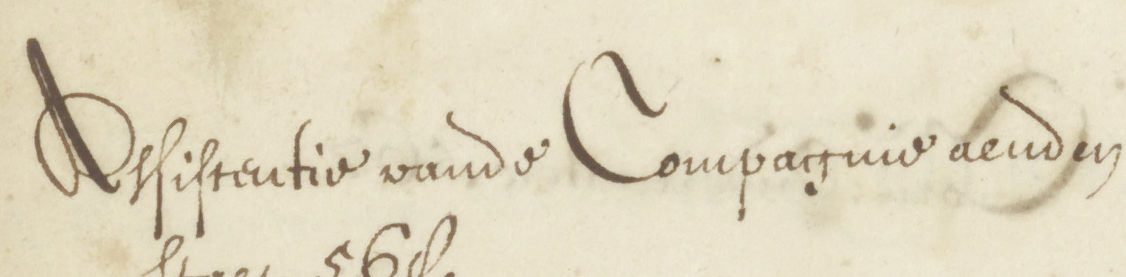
Assistentie vande Compagnie aenden
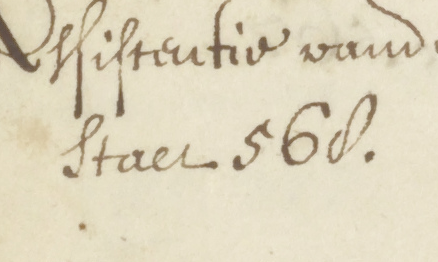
Staet 568.
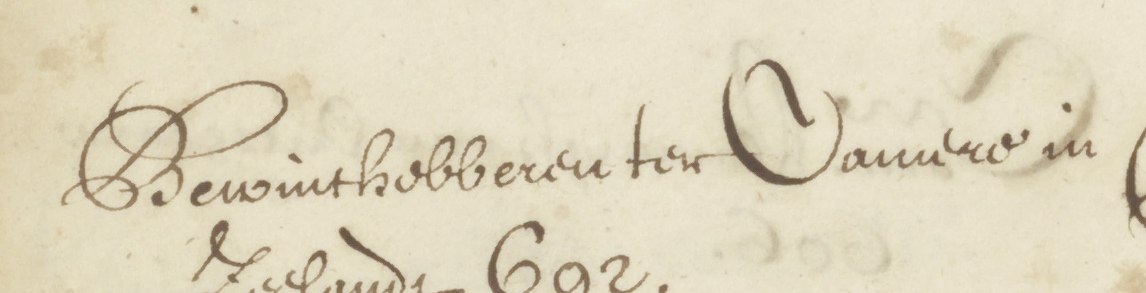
Bewinthebberen ter Camere in
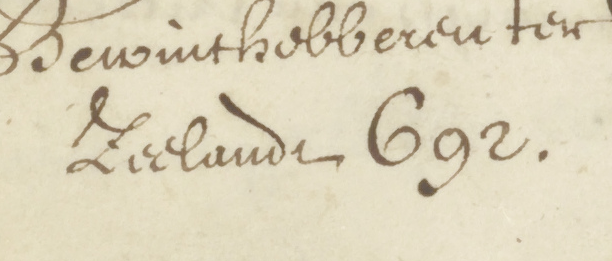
Zeelandt 692.
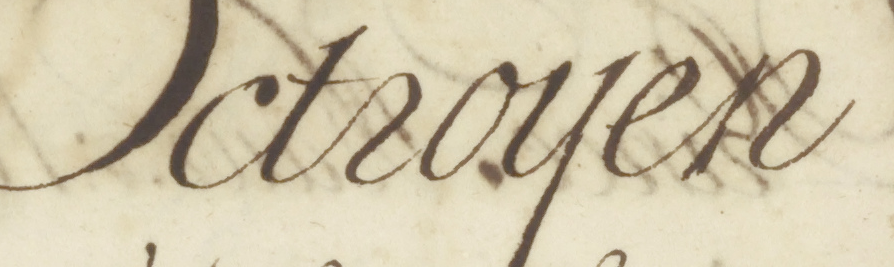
Octroijen
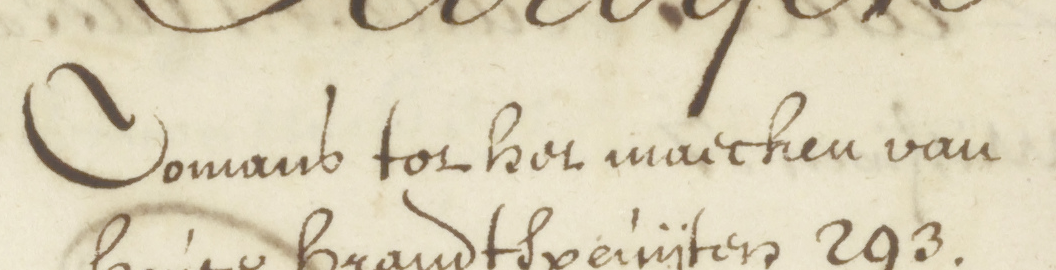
Comans tot het maecken van
